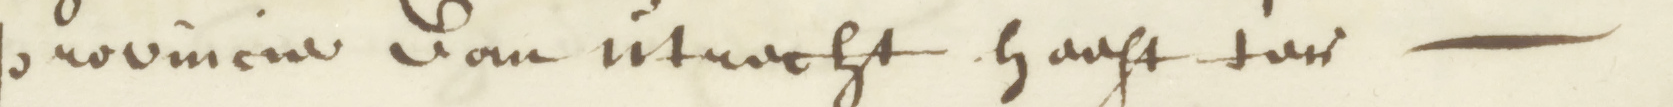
provincie van Utrecht heeft ter —
